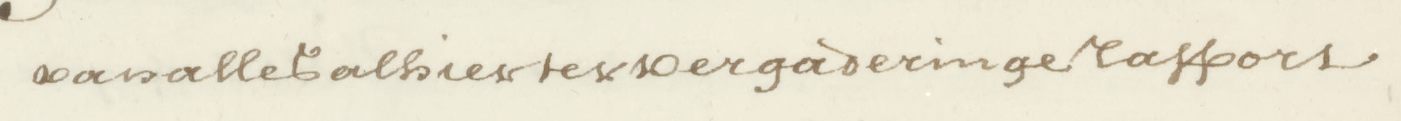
van alles alhier ter vergaderinge rapport
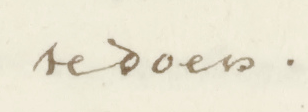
te doen.
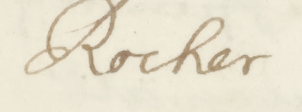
Rocher
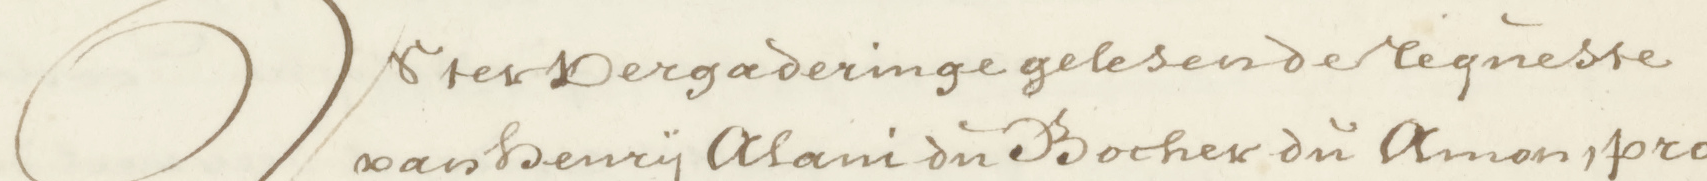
Is ter vergaderinge gelesen de requeste
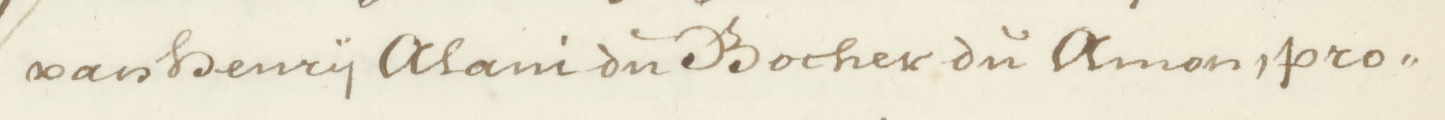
van Henrij Alani du Bocher du Amon pro,,
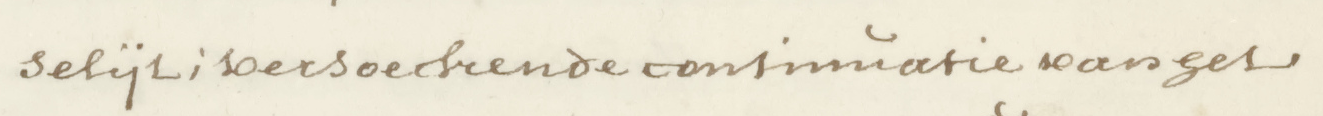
selijt; versoeckende continuatie van het
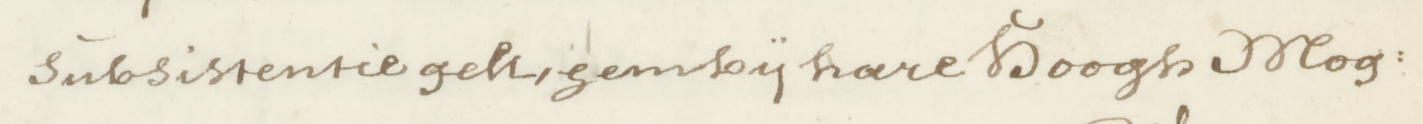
subsistentie gelt, hem bij hare Hoogh Mog:
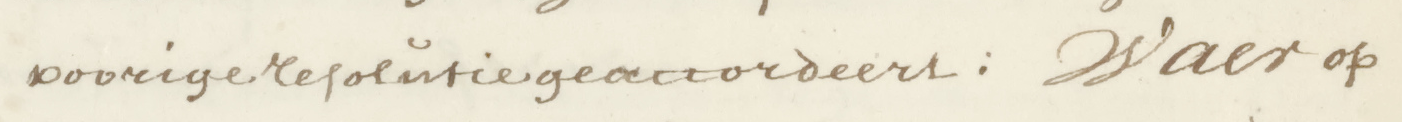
voorige resolutie geaccordeert: Waerop
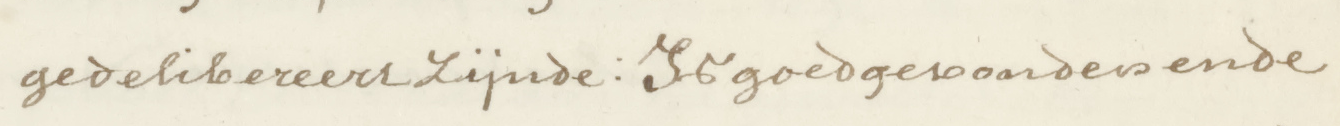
gedelibereert zijnde: Is goedgevonden ende
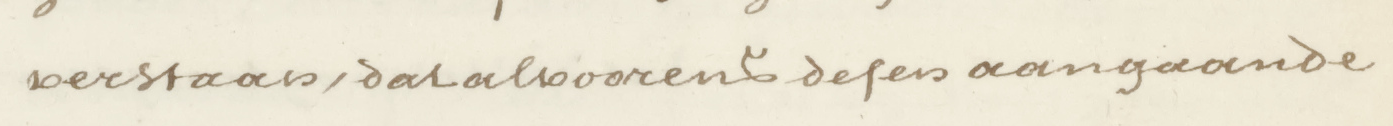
verstaan, dat alvoorens desen aangaande
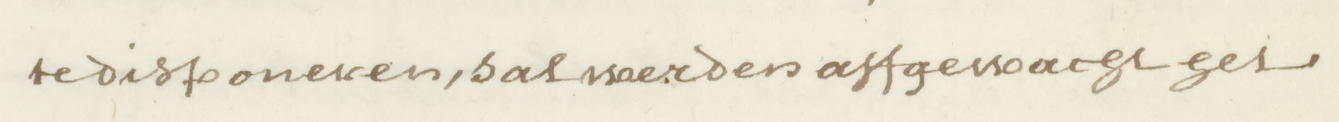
te disponeren, sal werden affgewacht het
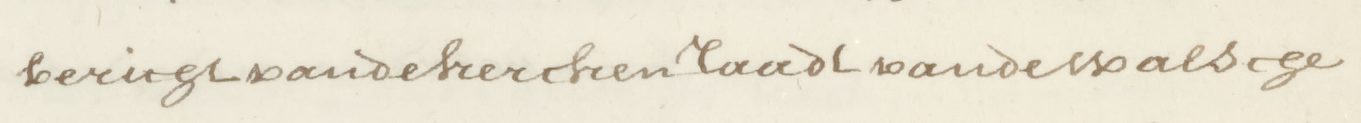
bericht vande kercken raadt vande walsche
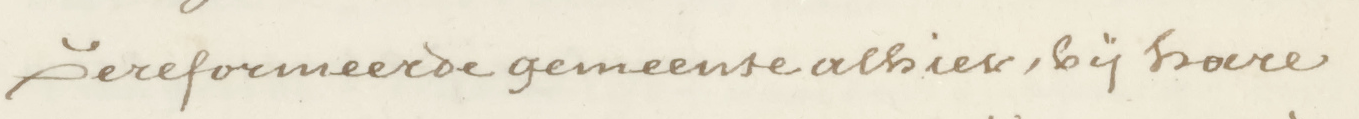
Gereformeerde gemeente alhier, bij hare
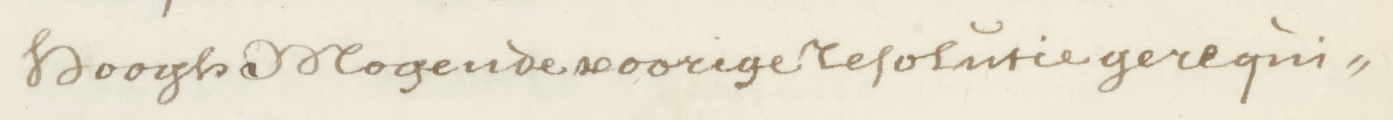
Hoogh Mogende voorige resolutie gerequi„
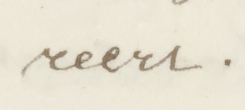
reert.
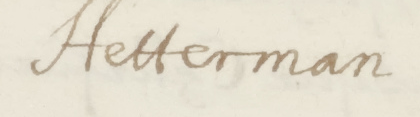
Hetterman
